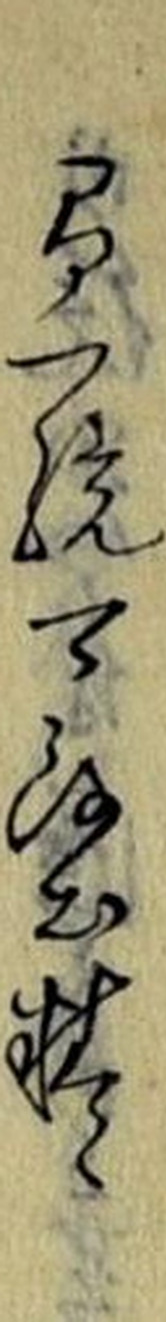間一統可致出精候
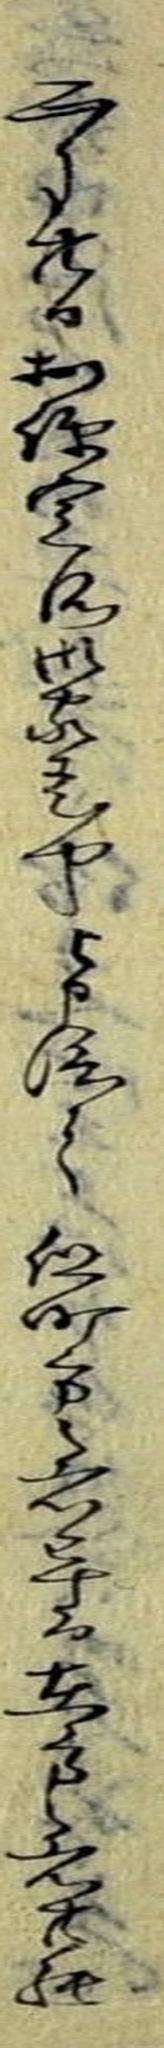正月廿日於評定所御家老中被申渡之但町方之者畢而在方之者共罷
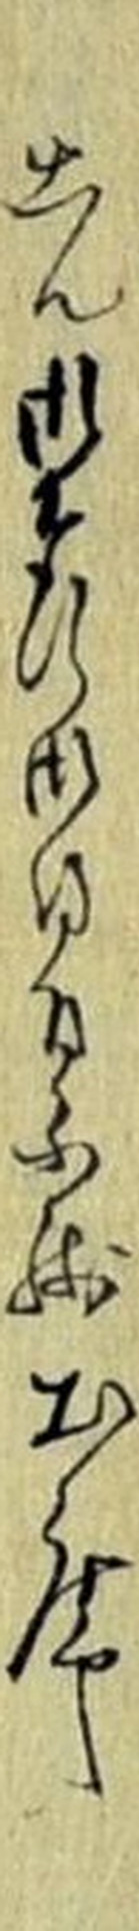出ル御奉行御目付不残出席
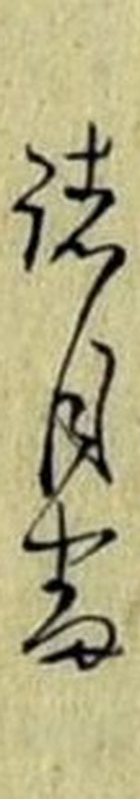諸月番
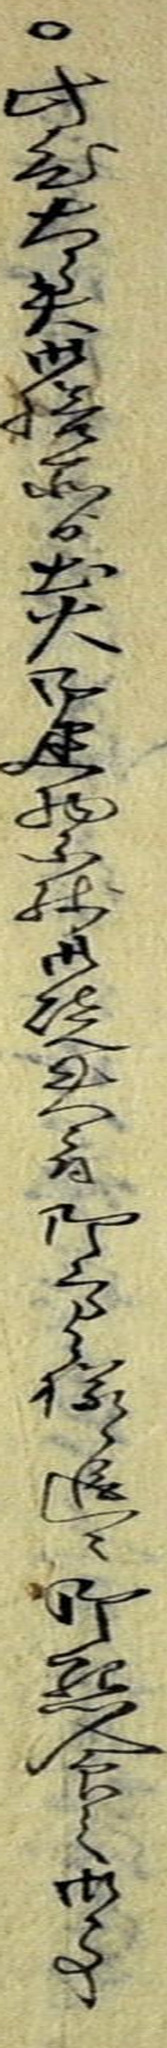○此度大奥御膳所ゟ出火御建物不残御焼失に付御方々様へ追々御懇命之御事
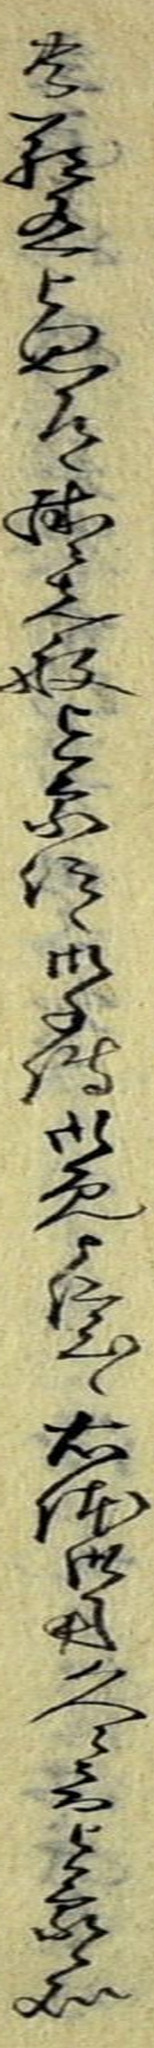共難有被思召候殊に先般被蒙仰候御手伝御免被仰出候右体御用久々に而被蒙候処
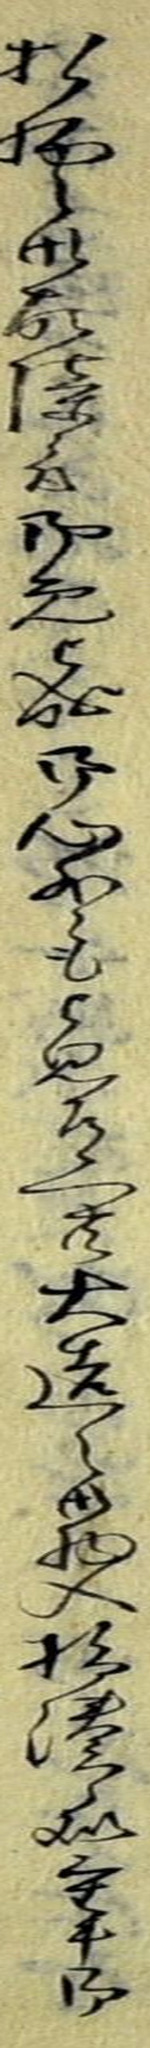折柄之御故障に付御免被成御心外にも被思召候へ共大造之御物入指湊候処重き御
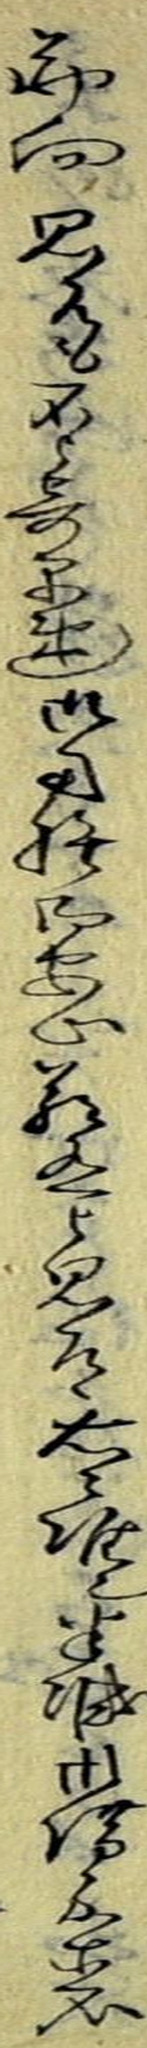勤向思召も不被寄早速御用捨御安心難有被思召候右に准し半減御借米等不
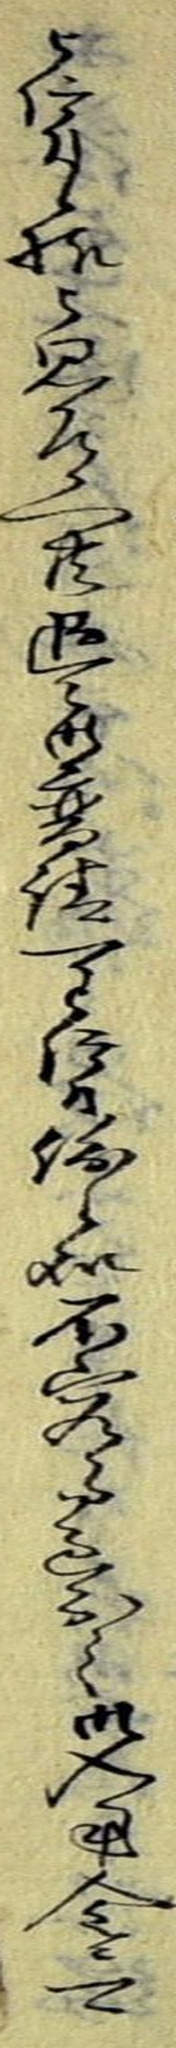被仰付候様被思召候へ共追々御普請可被仰付儀之処不容易過分之御入用金に可

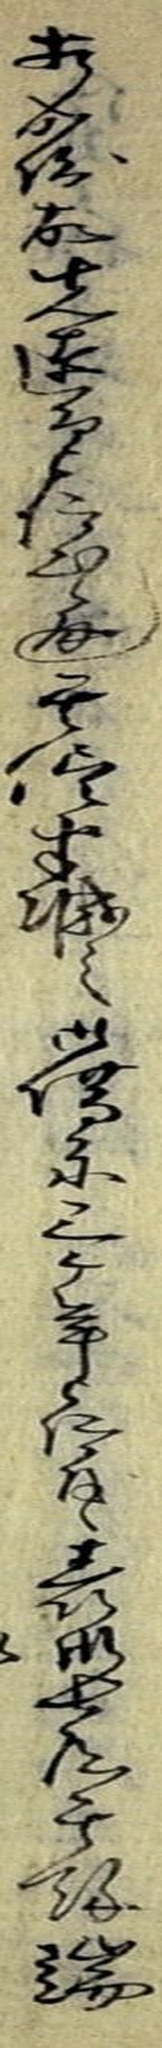相成儀故先達而被仰出候通其侭半減之御借米三ヶ年被仰付候表御長屋其余端
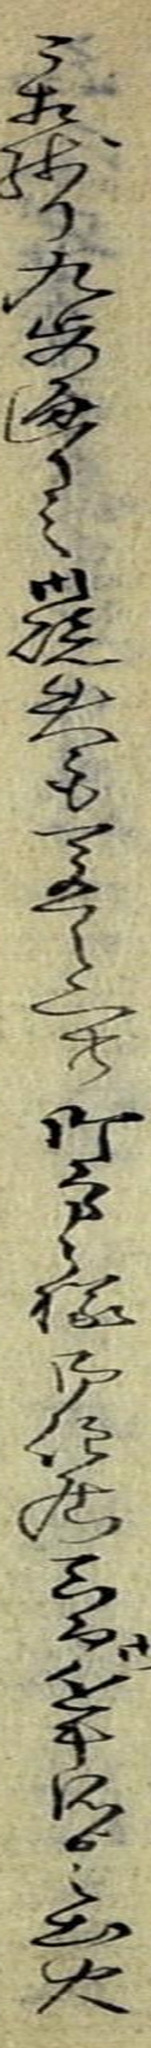々相残り九歩通り之御焼失にも可有之候へ共御方々様御住居至而御近キ所ゟ之出火
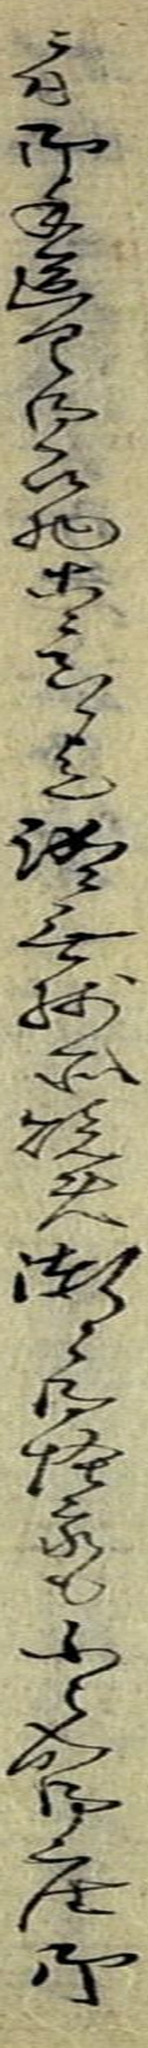に付御手道具御召物等に至候迄誠に無残所焼失漸々御怪我も不被成御座御
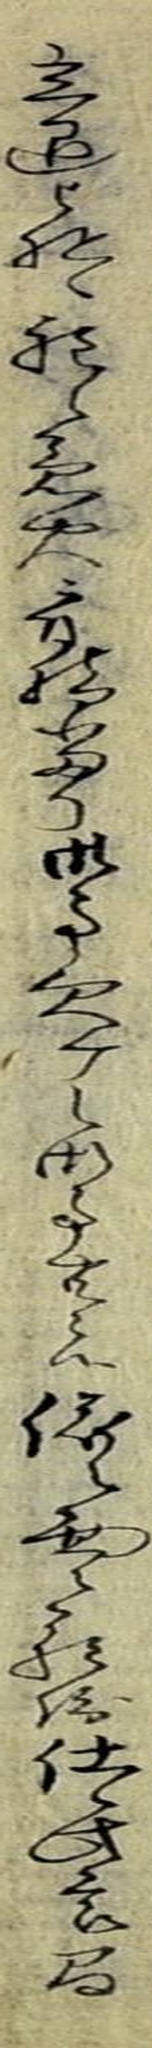立退被遊候程之急火に付指当り御事欠ヶ之御事共に候依之面々難儀仕候此節間
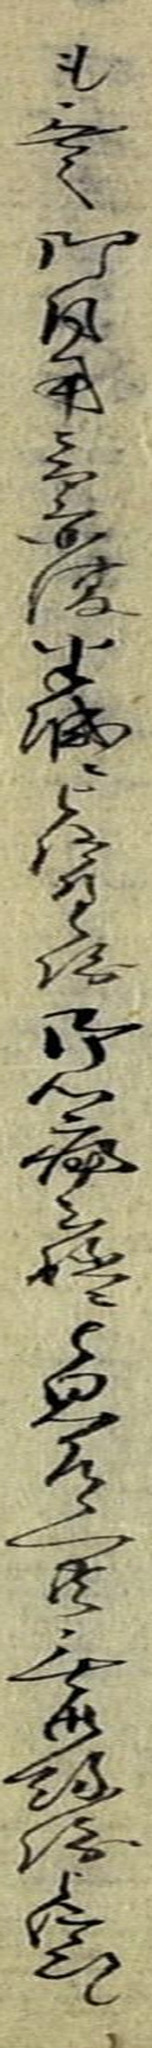も無之御日用に而亦復半減に被仰付候儀御心痛至極に被思召候へ共無御余儀被仰出候
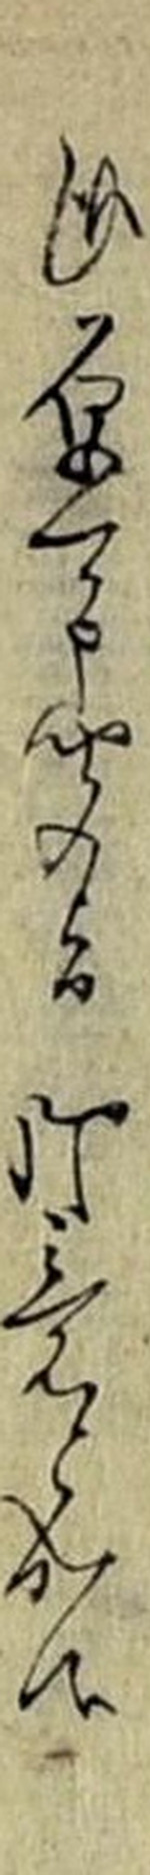趣厚可申聞旨御意被成候
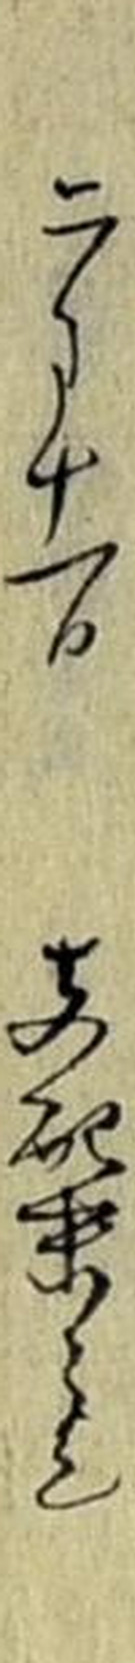二月十一日支配末々迄
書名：命令之部 四
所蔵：福井県文書館 Fukui Prefectural Archives
